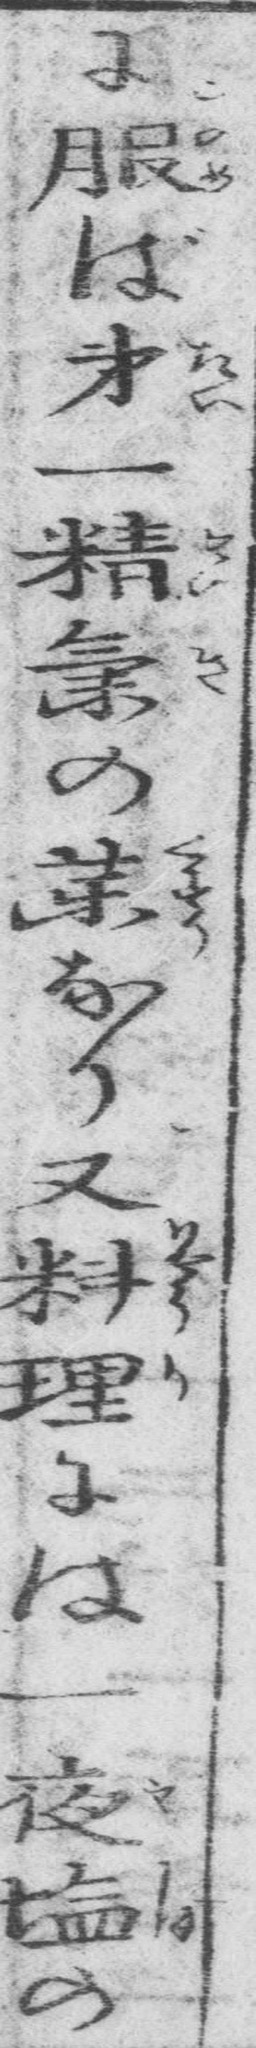に。服ば第一精気の薬なり。又料理には一夜塩の
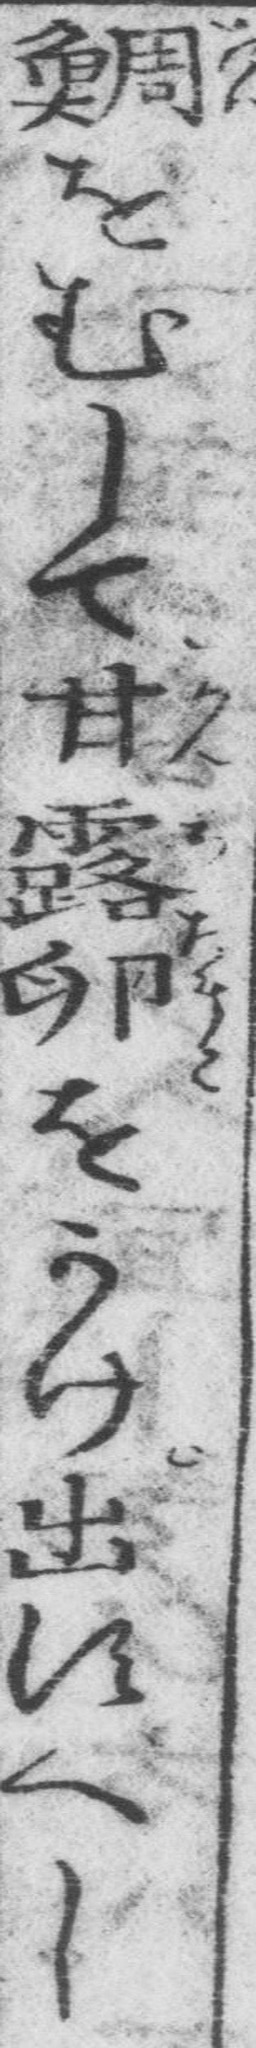鯛をむして。甘露卵をかけ。出すへし
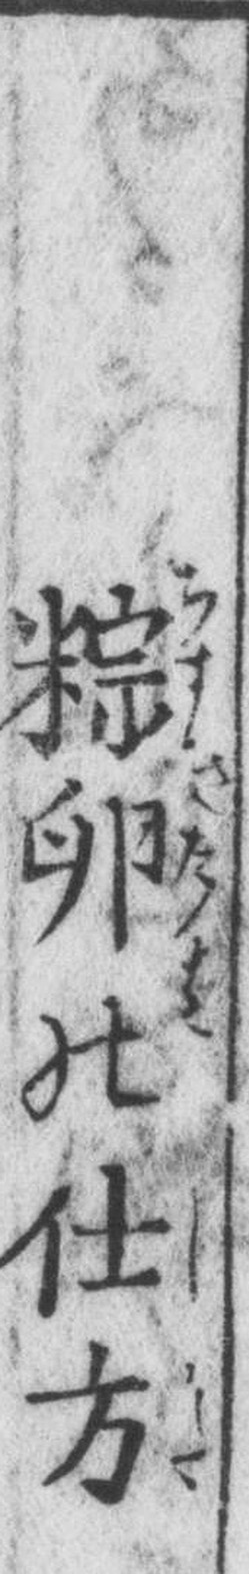粽卵の仕方
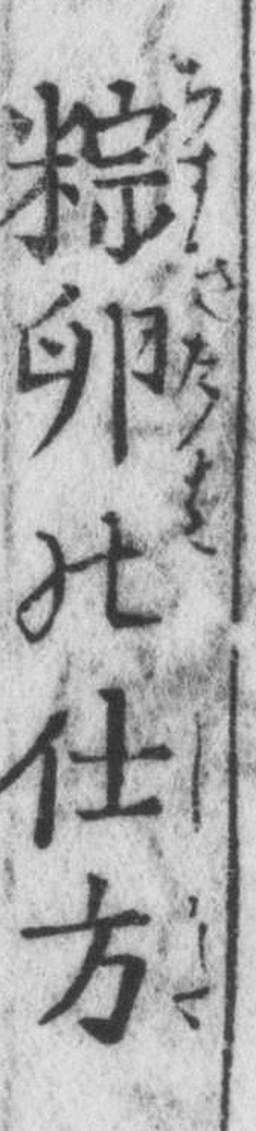粽卵の仕方
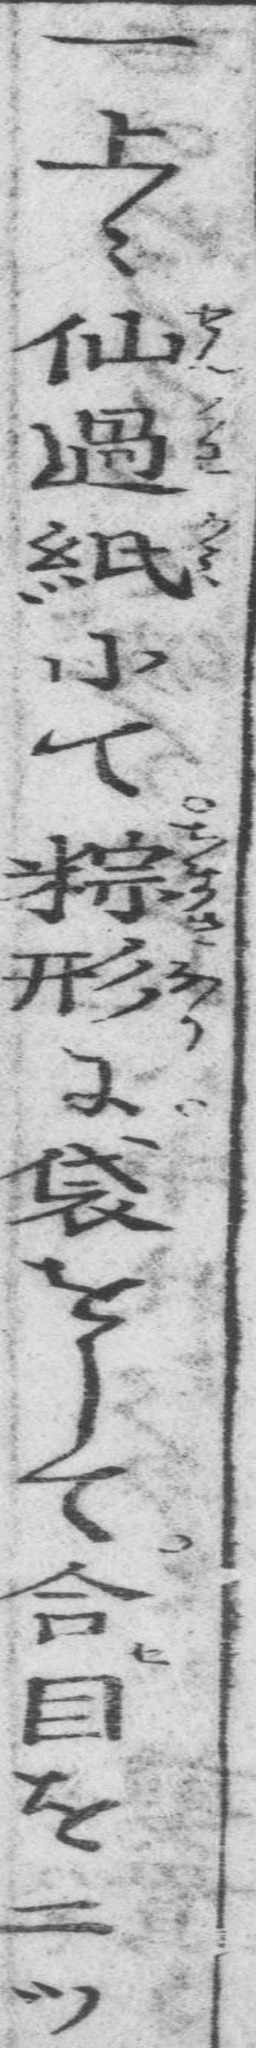一上々仙過紙にて。粽形に。袋をして。合せ目を二ツ
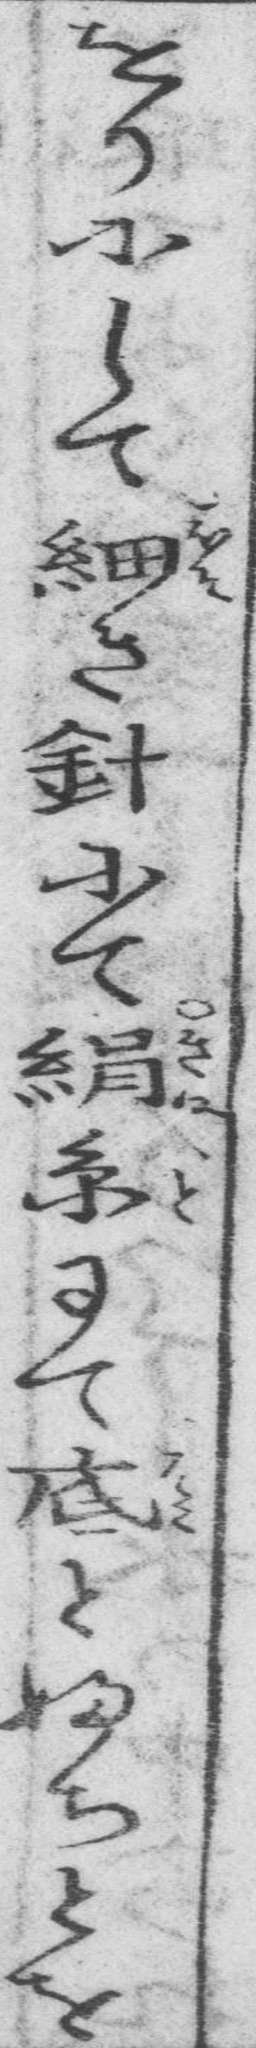をりにして。細き針にて。絹糸にて。底とふちとを
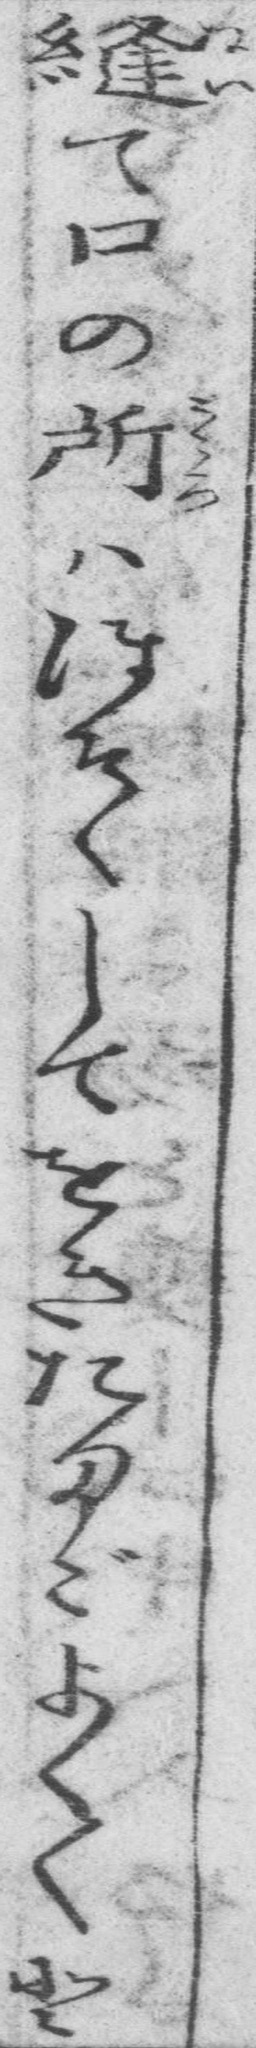縫て口の所はほそくしてをきたまごよく〳〵と

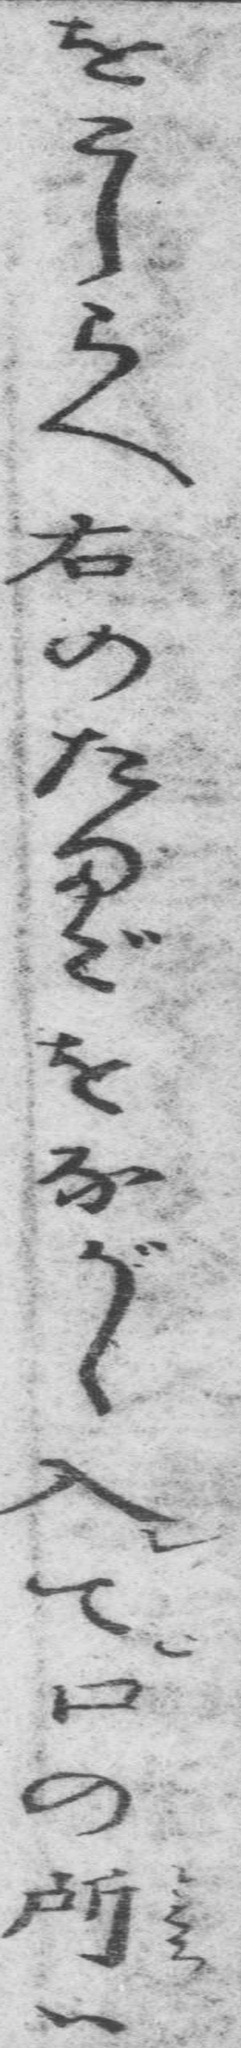をこしらへ右のたまごをながし入れて。口の所は
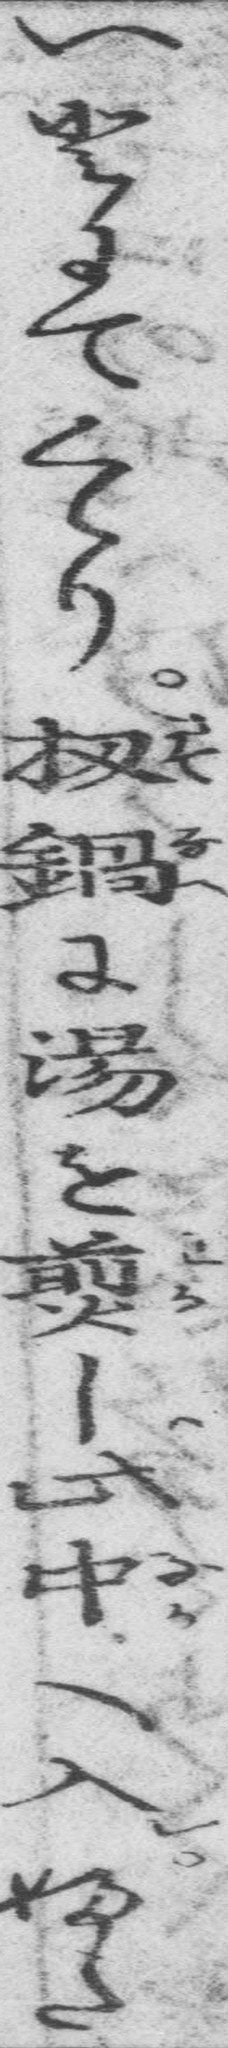いとにてくゝり。扨鍋に湯を煎し。此中へ入れ。ふた
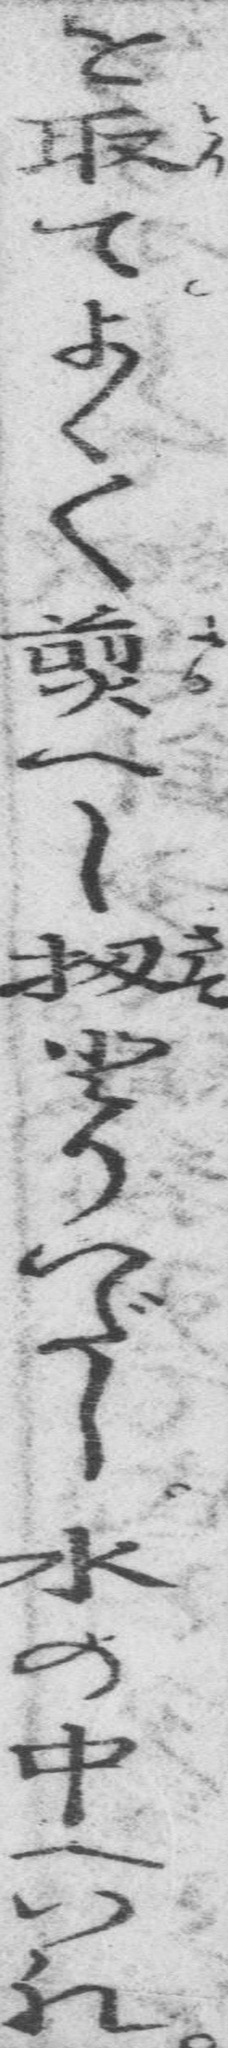を取て。よく〳〵煎へし扨とりいだし。水の中へいれ。
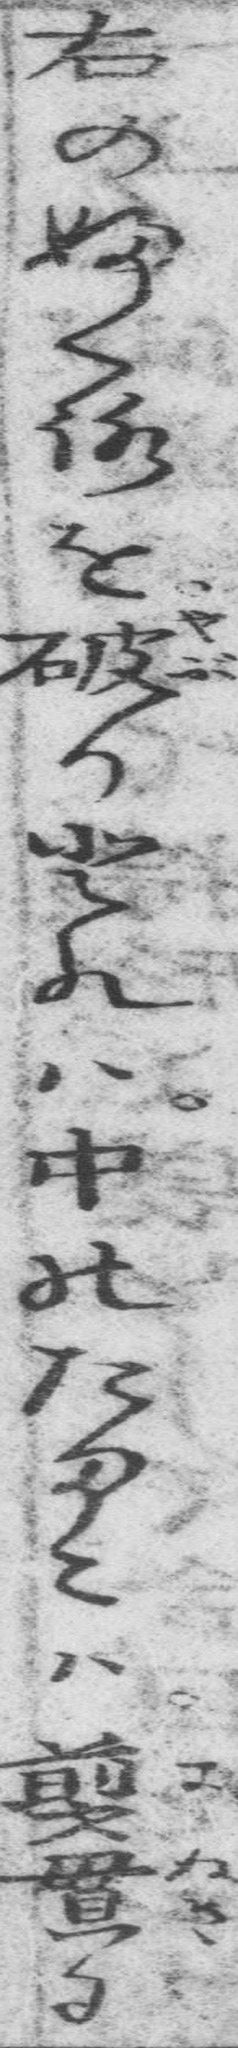右のふくろを。破りとれは。中のたまこは。煎貫に
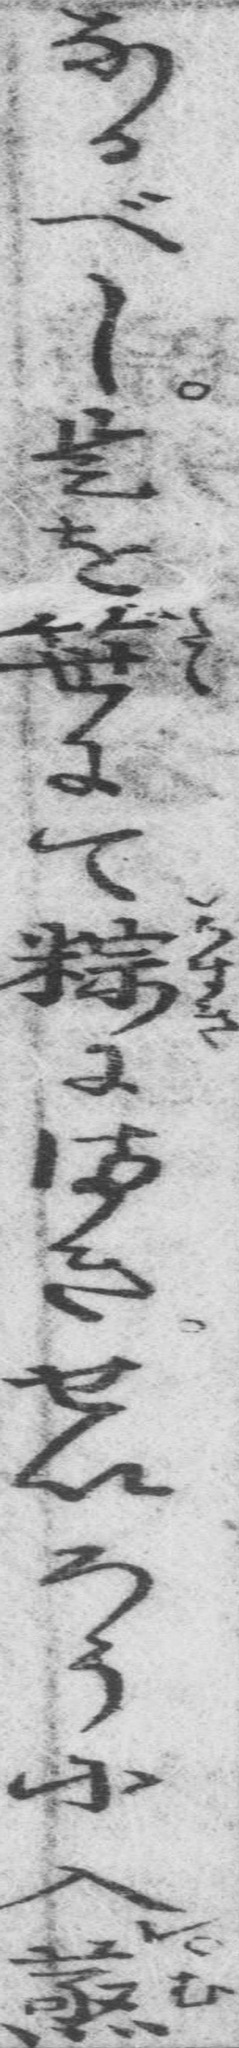なるべし。是を笹にて。粽にまき。せいろうに入れ。蒸
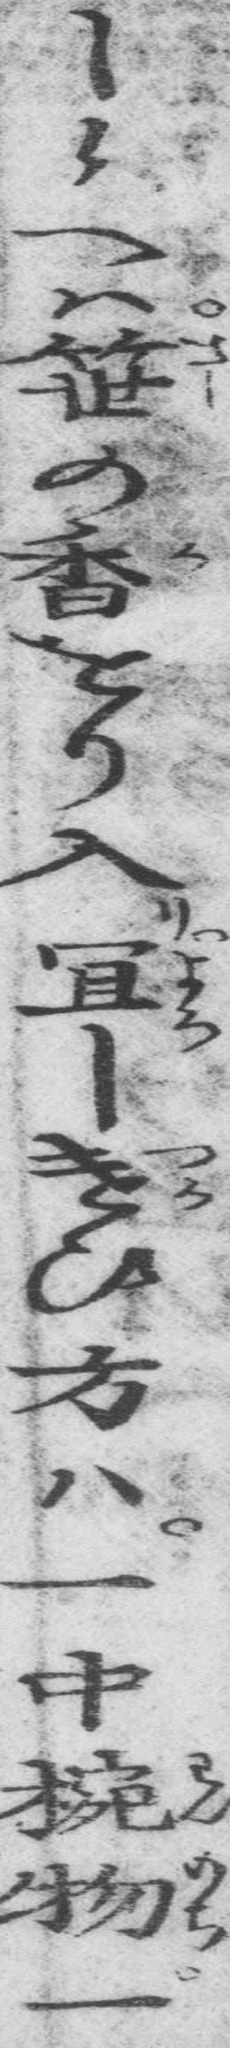し候へは。笹の香をり入り。宜し遣ひ方は。一中椀物。一
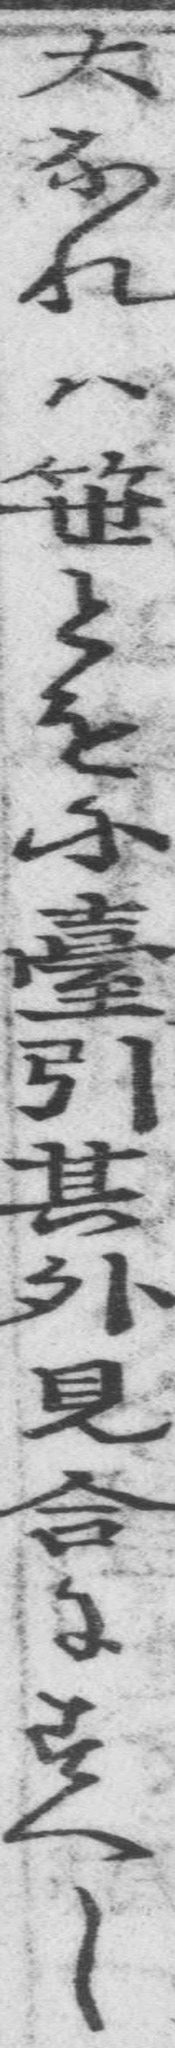大なれは。笹ともに。台引。其外見合にすへし
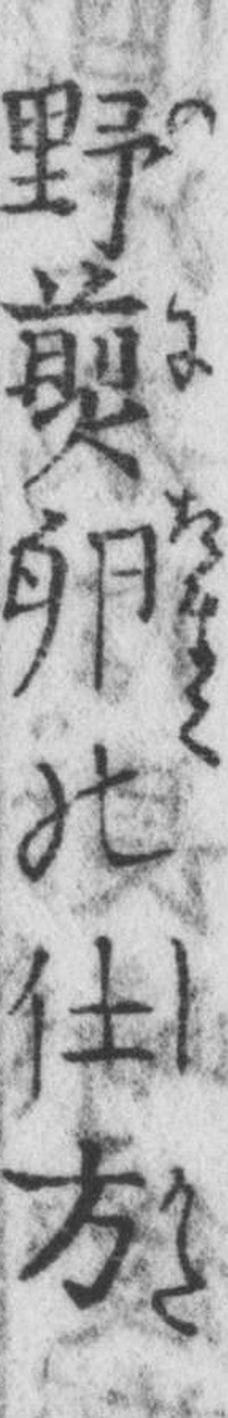野煎卵の仕方
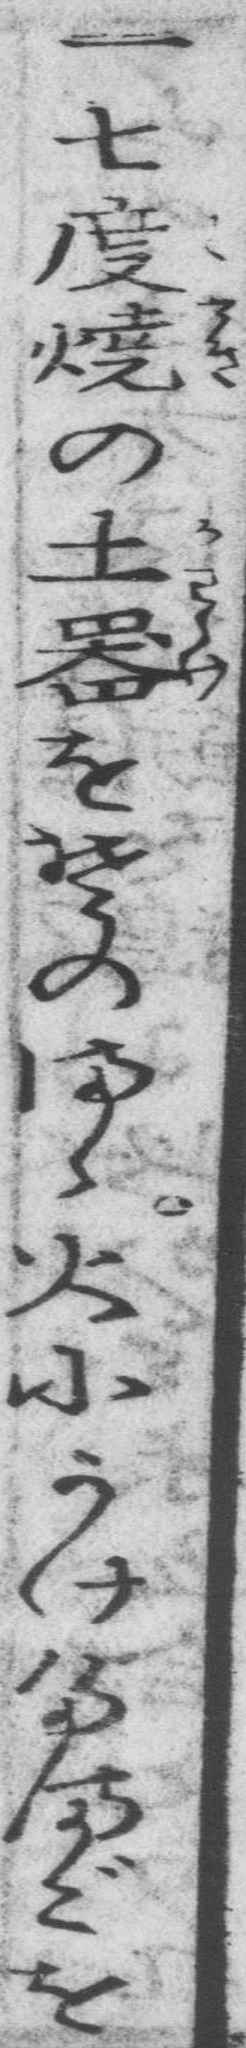一七度焼の土器をそのまゝ。火にかけたまごを
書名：萬寳料理秘密箱
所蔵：大阪府立大学学術情報センター 国文学研究資料館
